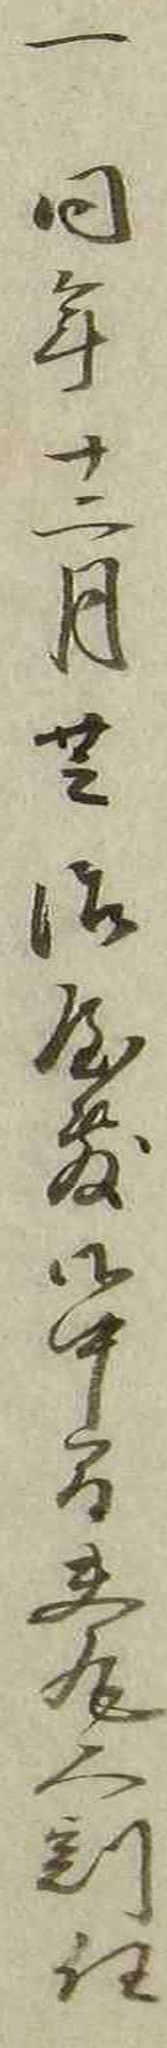一同年十二月芝御屋敷御中間夫丸人割任
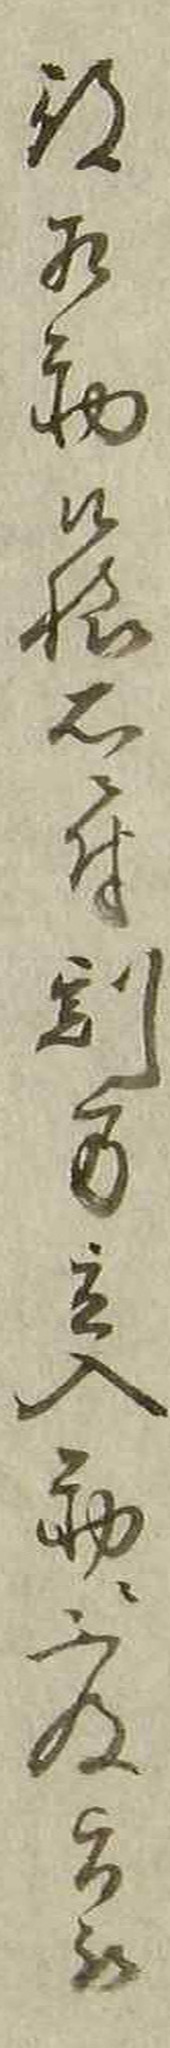役相勤候様右ニ付割方立入勤ニ不及旨被
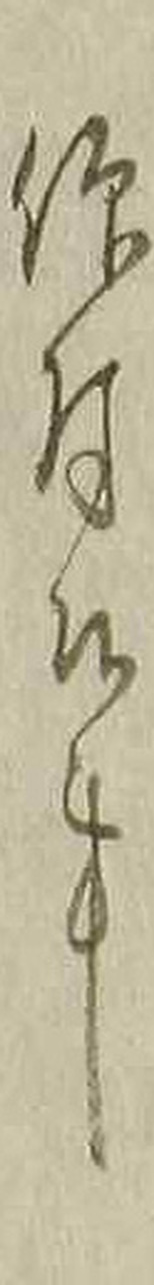仰付候事
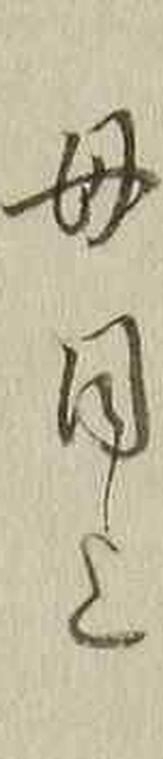母同上
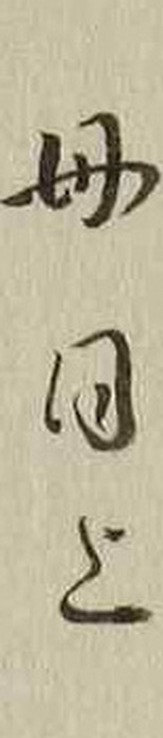母同上
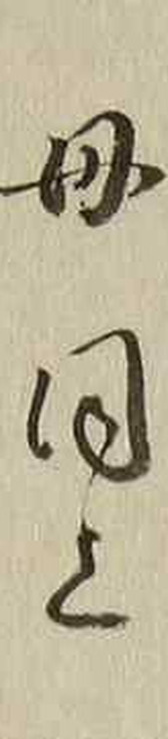母同上
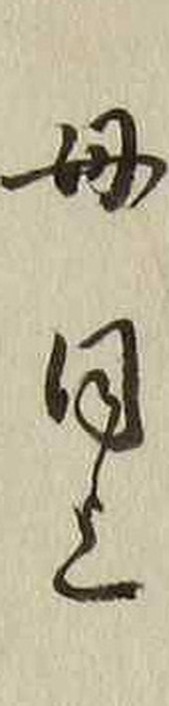母同上
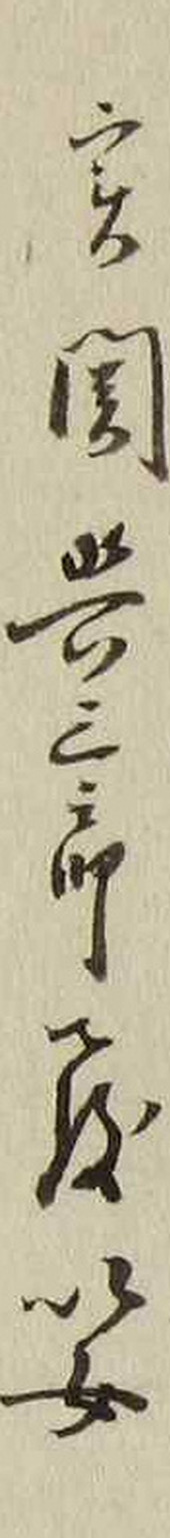実関与三郎教以女
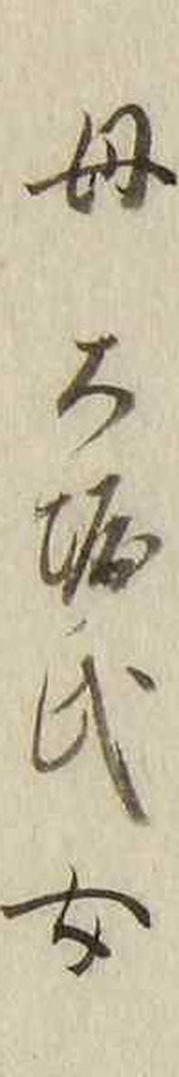母大堀氏女

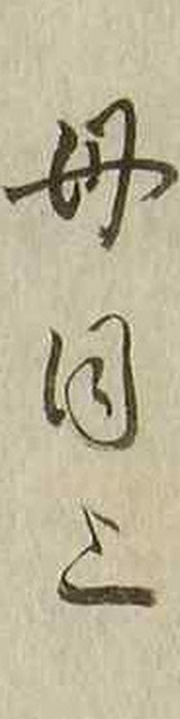母同上
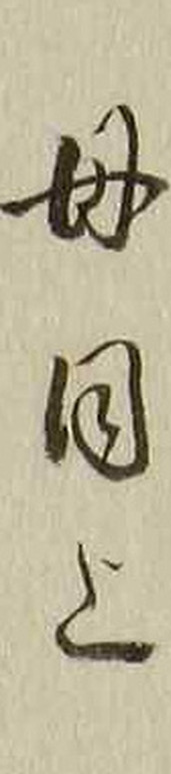母同上
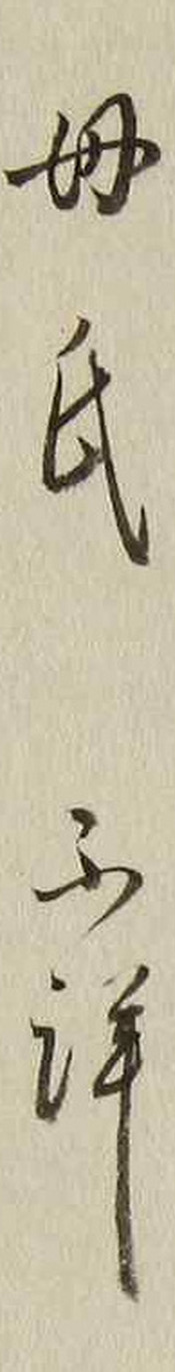母氏不詳
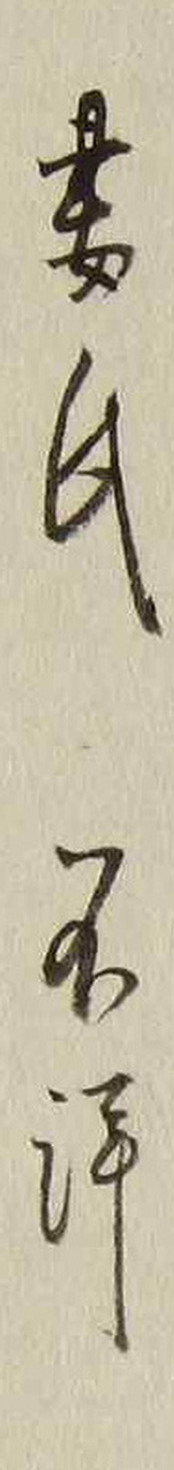母氏不詳
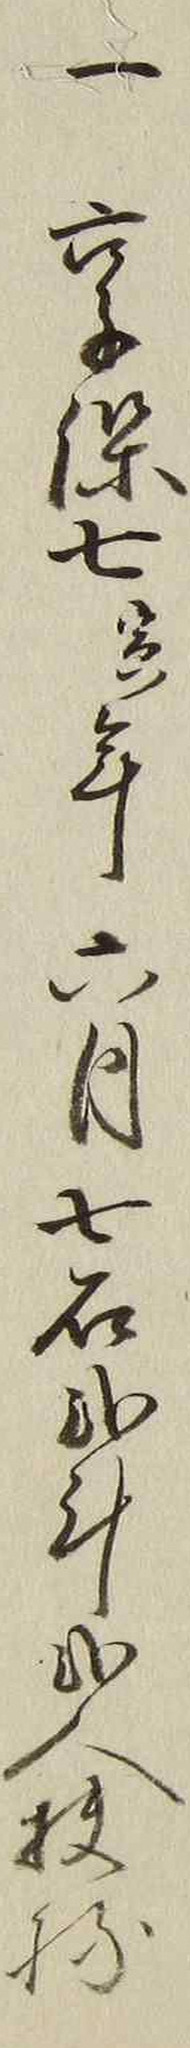一享保七寅年六月七石弐斗弐人扶持
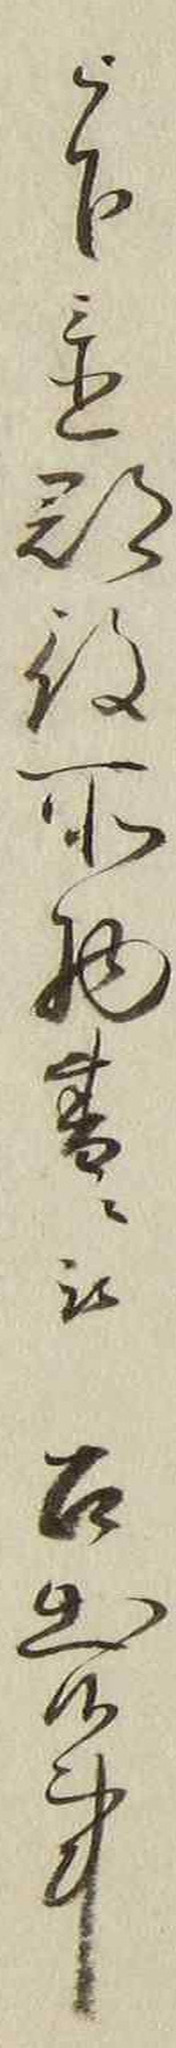被下置郡役所物書ニ被召出候事
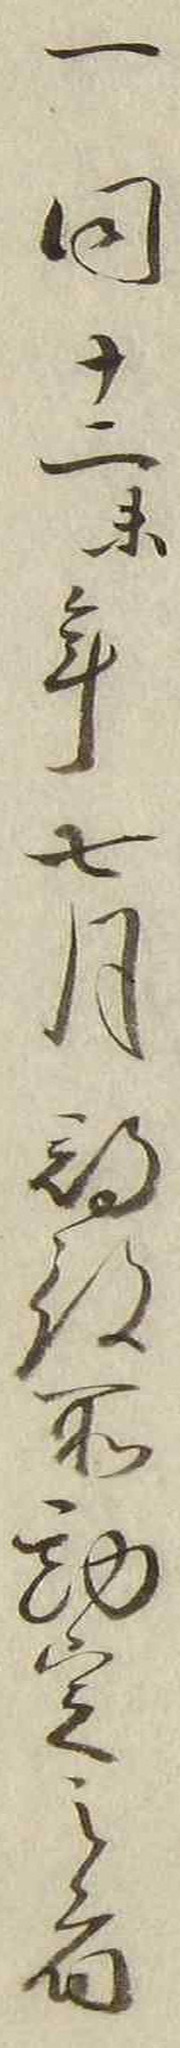一同十二未年七月郡役所勘定之者
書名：諸士系譜　巻之132　た之部8
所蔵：会津若松市立会津図書館
